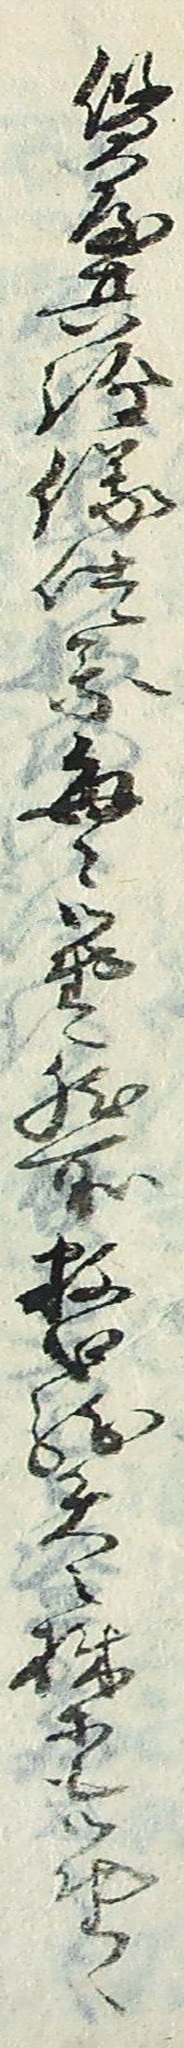質屋共詮儀仕候義毎々御坐候然所数口紛失之株等も御坐候
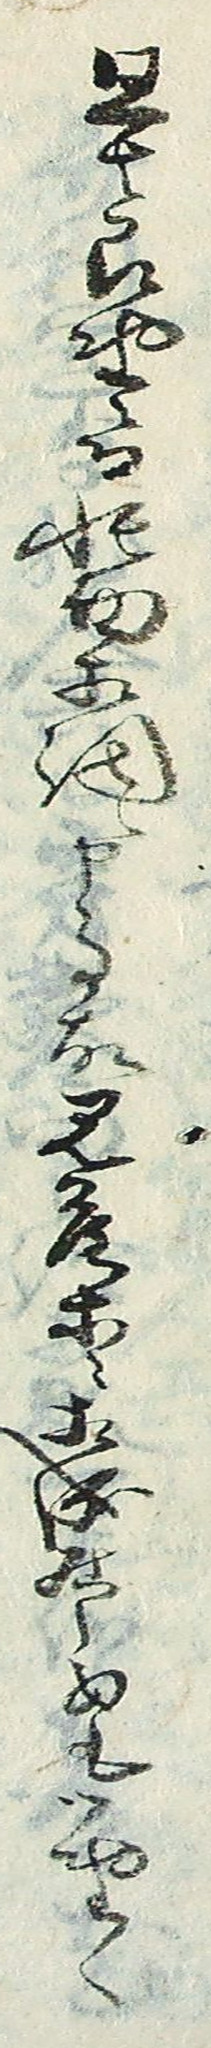且者即坐ニ而帳面相調へ申事故見落等ニ相成居申義も御坐候
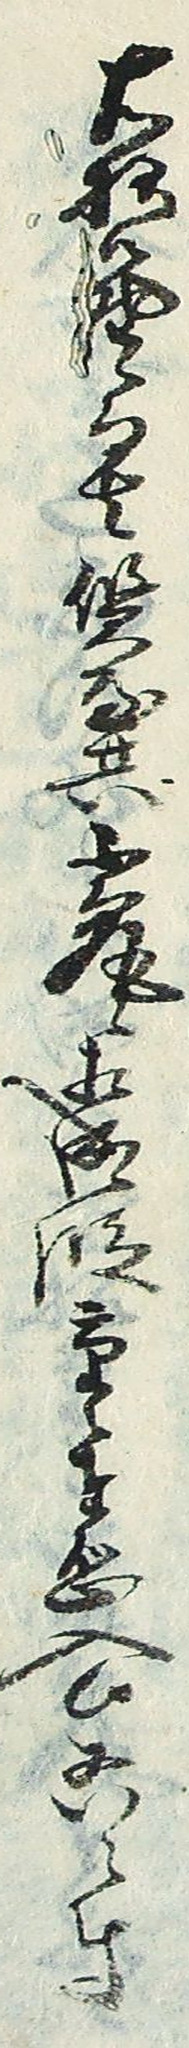右様御坐候而者質屋共不究ニ相成候段重々奉恐入候右ニ付

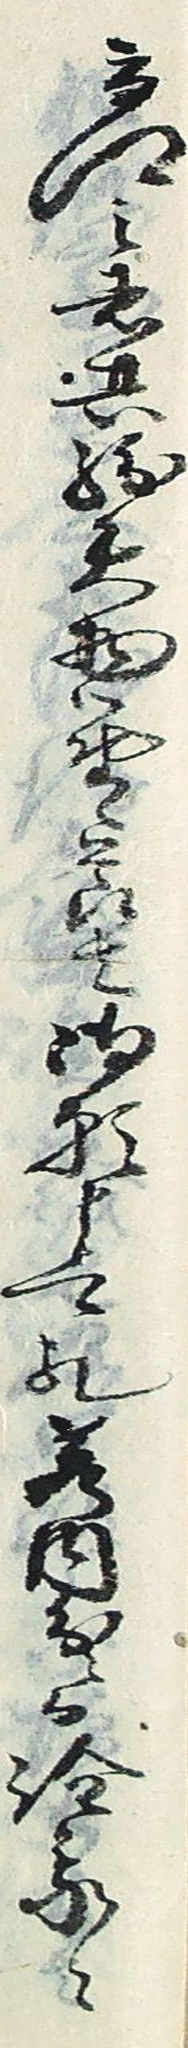市郷之者共紛失物御坐候節者御願申上候歟若内分ニ而詮義ニ
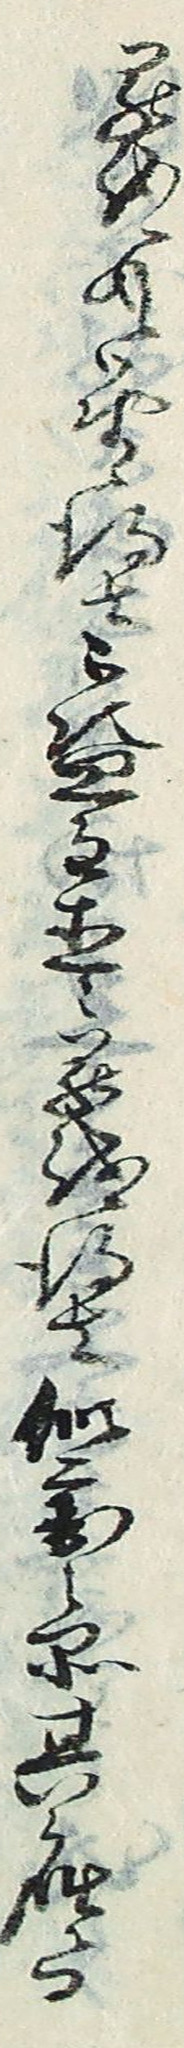罷越候義ニ御坐候得者被盗主直々罷越候得者似寄之品其座ニ而
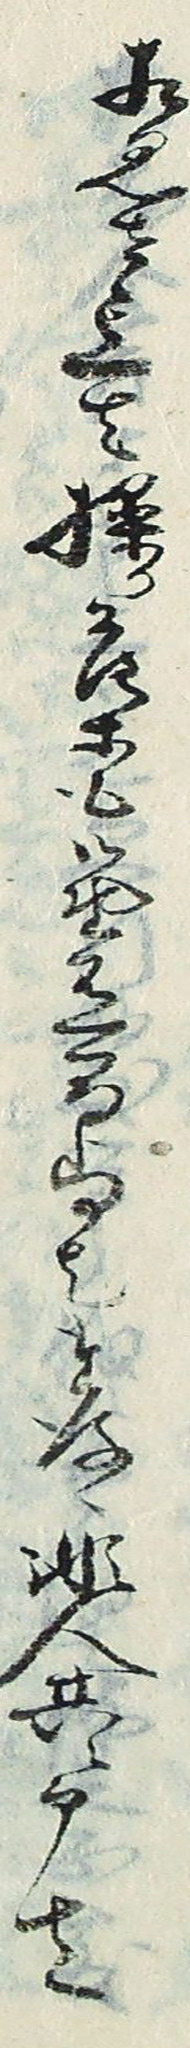相見せ候上者操り落等も御坐有間布と奉存候非人共ニ而者
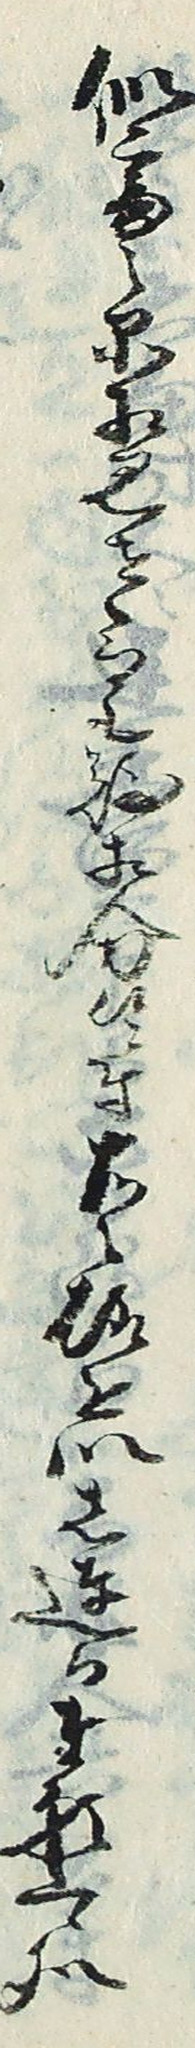似寄之品相見せ候而も難相分候ニ付右之趣を以先達而奉願上候処
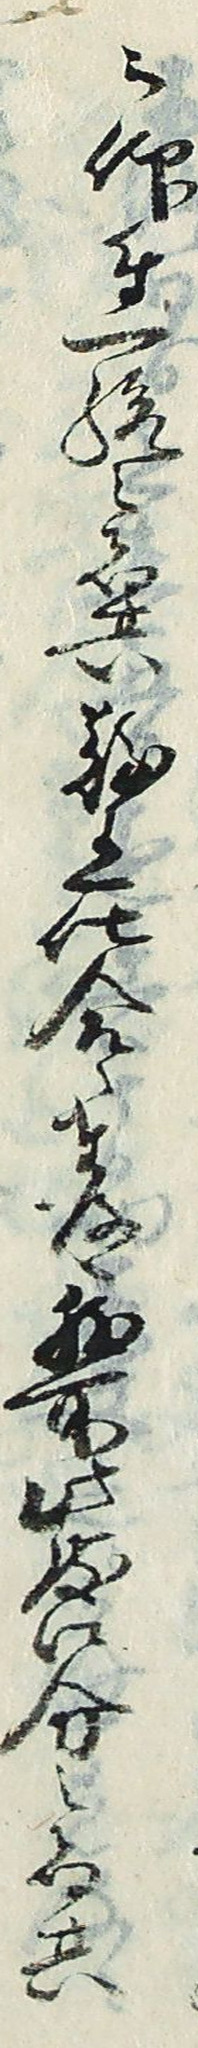被仰付一統之者共難有仕合ニ奉存候然所此度郷分之者共
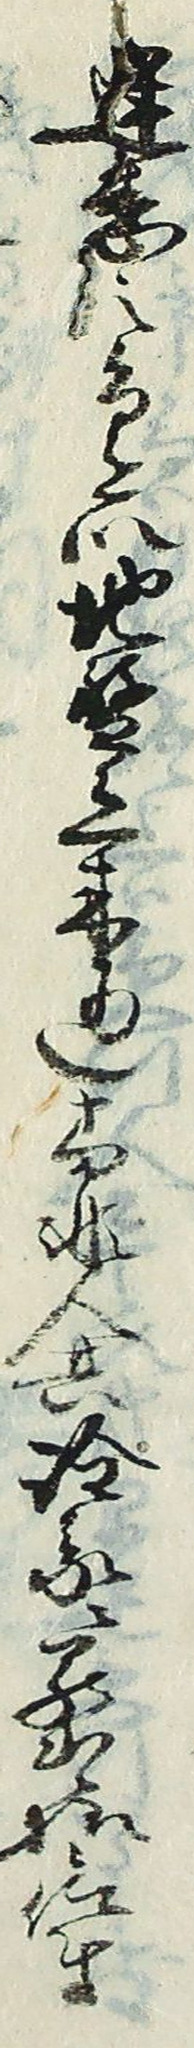迷惑之旨を以地盤有来通番非人共詮義ニ罷出候様被仰付
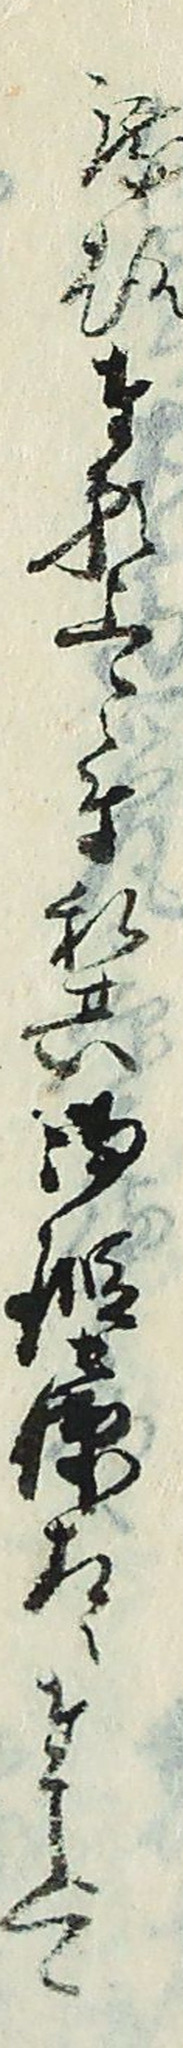度趣奉願上候ニ付私共御鍛被仰左へ奉申上候
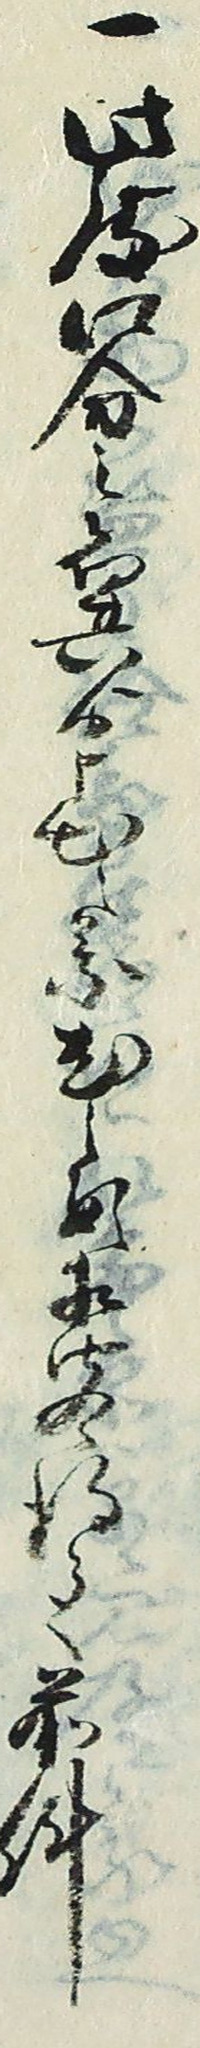一此度郷分之者共ゟ申出之義尤之義ニ相聞候得とも前件
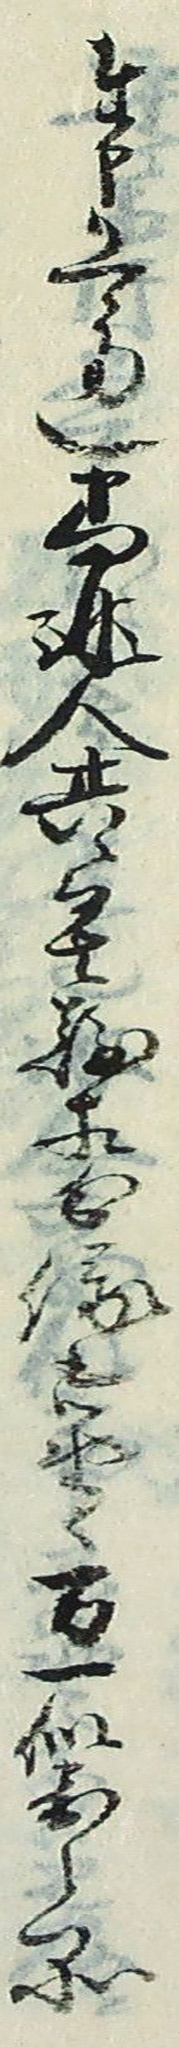奉申上候通番非人共ニ而者難相分儀も御坐候万一似寄之品
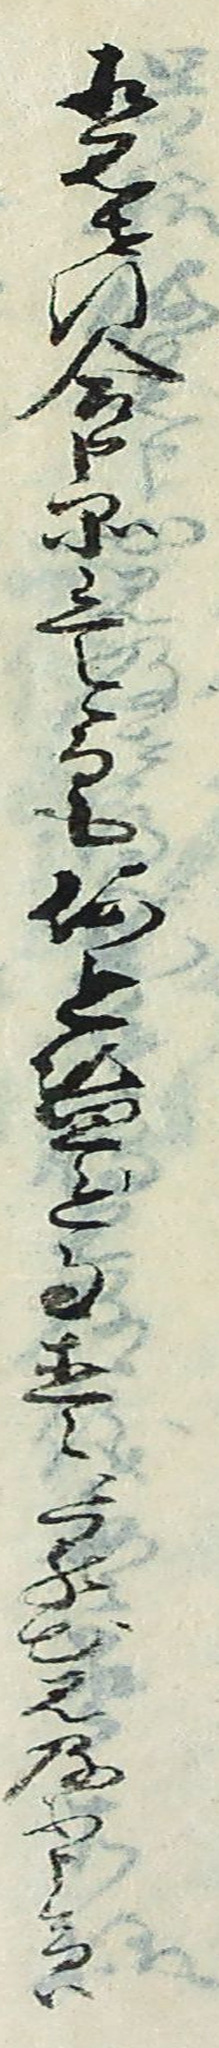相見せ引合申品有之候而も何を盗とり直々ニ罷出見及不申候而ハ
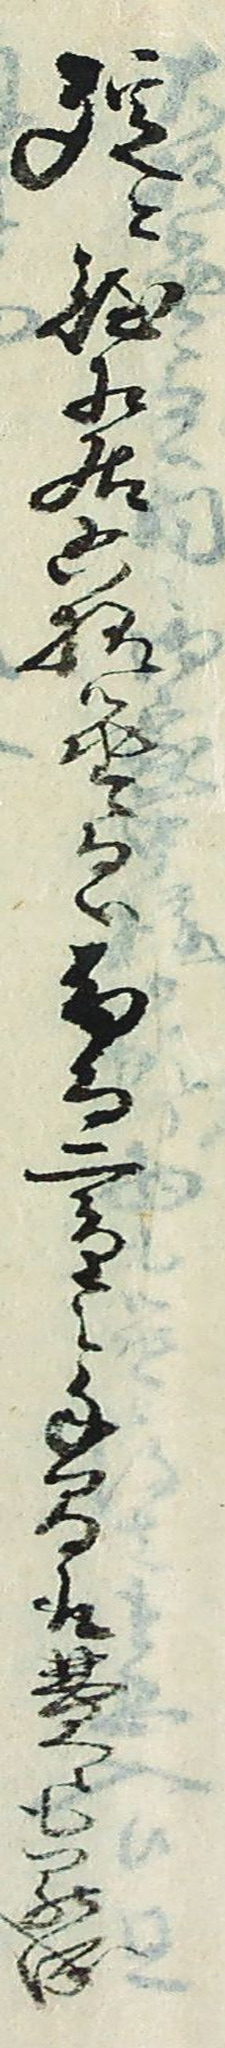聢と難相居右様御坐候而ハ分而二重之手間取費ニも罷成
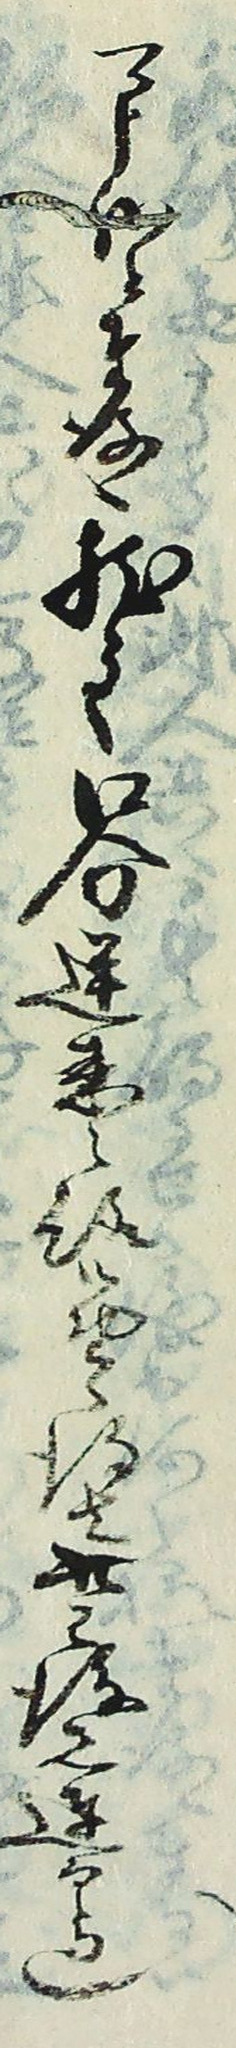可申哉と奉存候然とも郷分迷惑之趣御坐候得者此已後先達而之通
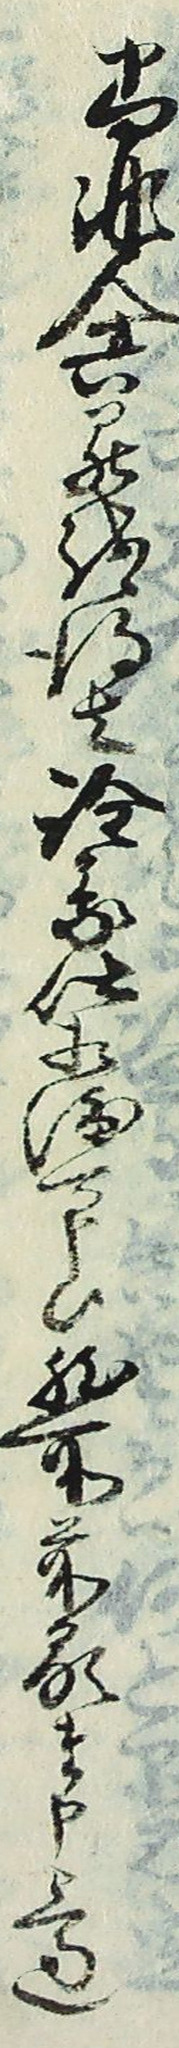番非人共罷越候得者詮義仕相渡可申候然所前顕奉申上通
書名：市郷質屋株御取究並御書出御趣法之写
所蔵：鳴門教育大学 Naruto University of Education
